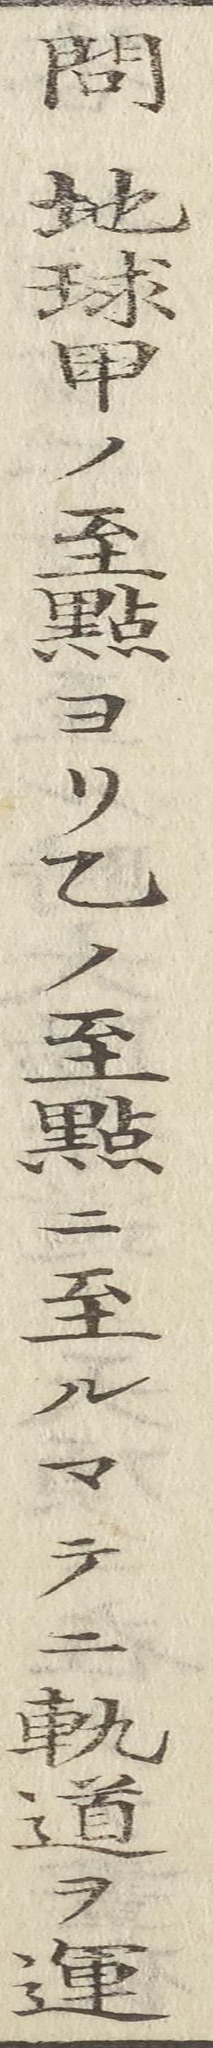問地球甲ノ至点ヨリ乙ノ至点ニ至ルマテニ軌道ヲ運
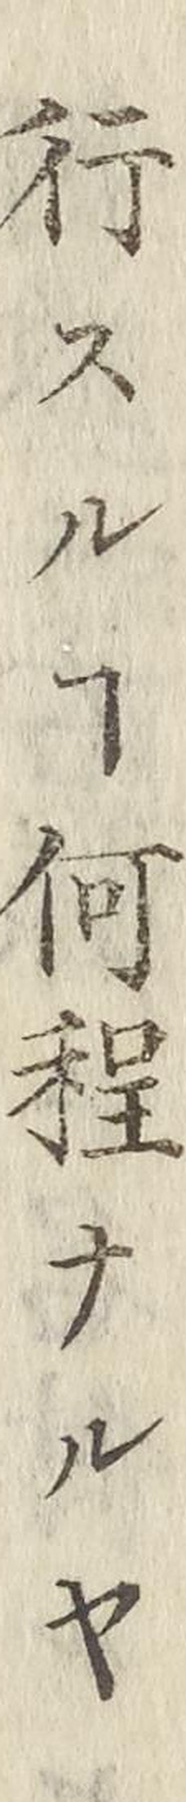行スルコト何程ナルヤ
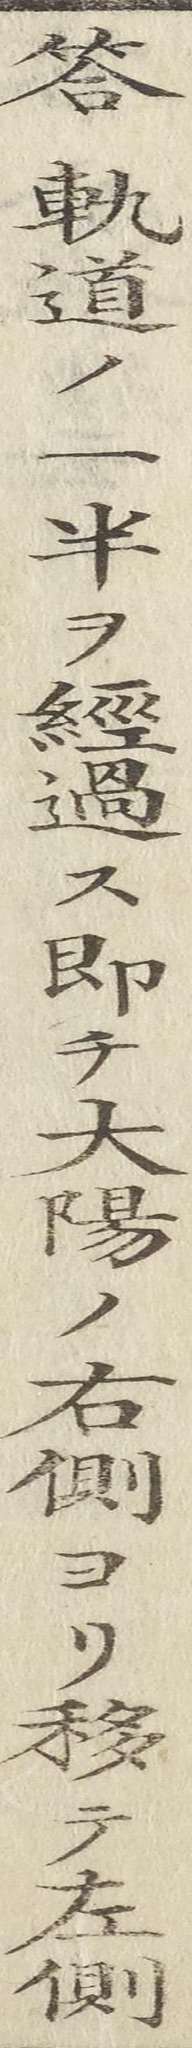答軌道ノ一半ヲ経過ス即チ大陽ノ右側ヨリ移テ左側
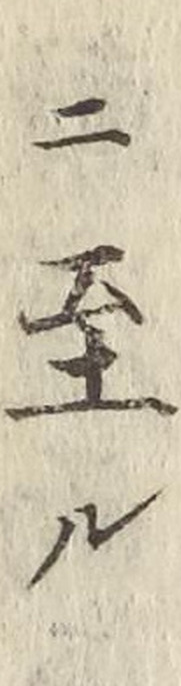ニ至ル

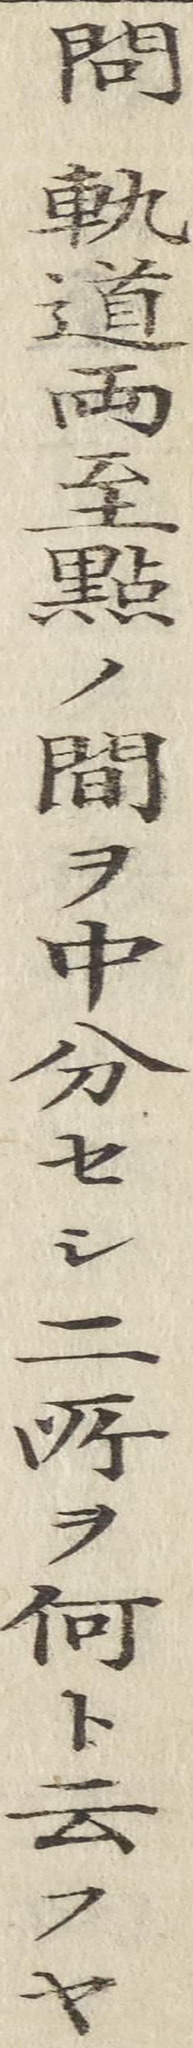問軌道両至点ノ間ヲ中分セシ二所ヲ何ト云フヤ
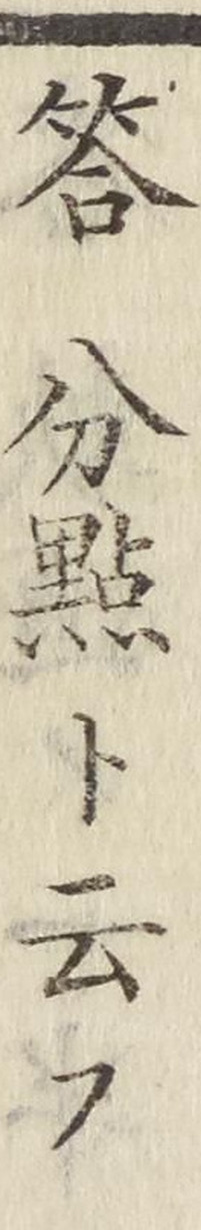答分点ト云フ
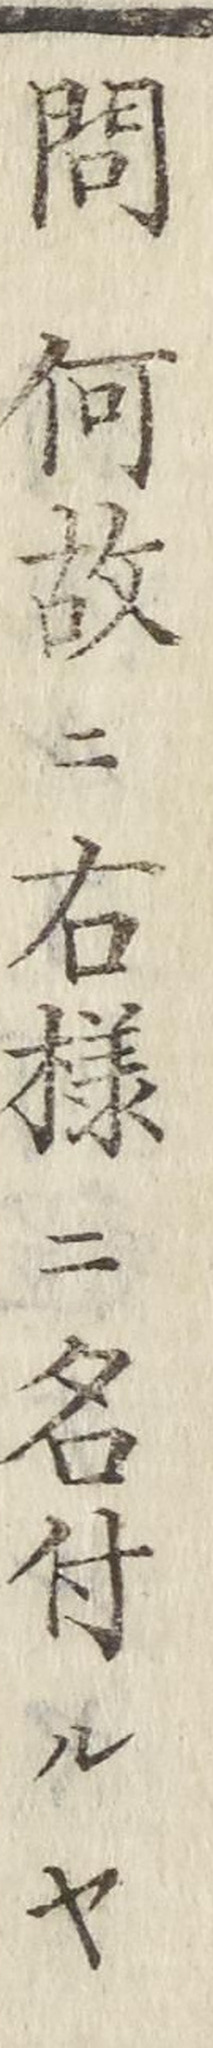問何故ニ右様ニ名付ルヤ
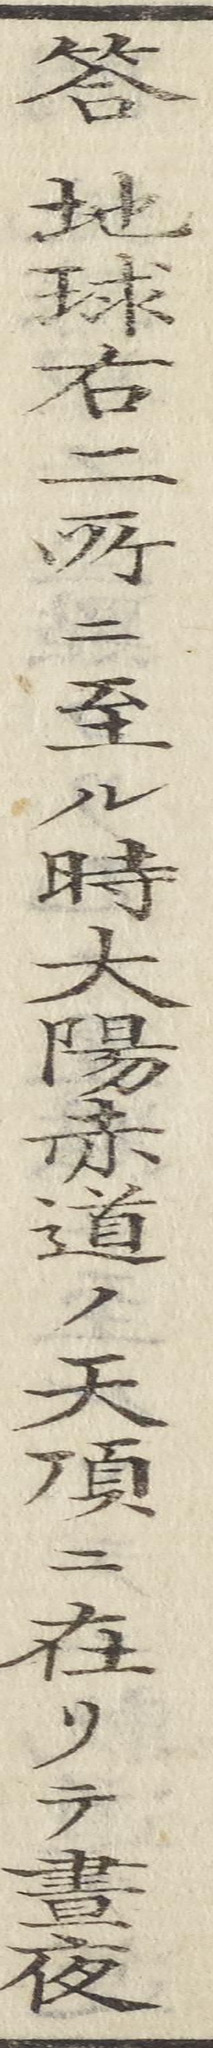答地球右二所ニ至ル時大陽赤道ノ天頂ニ在リテ昼夜
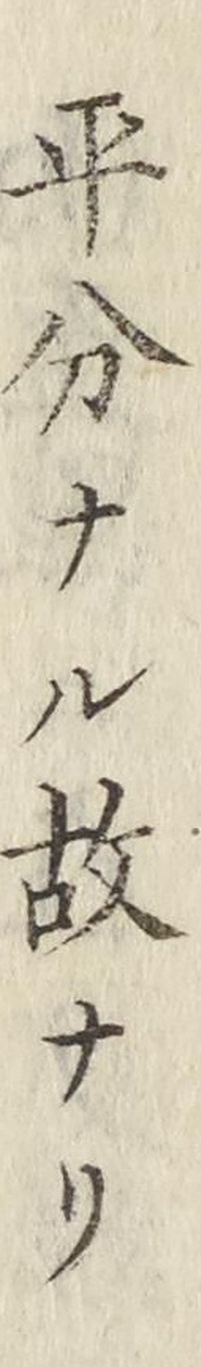平分ナル故ナリ
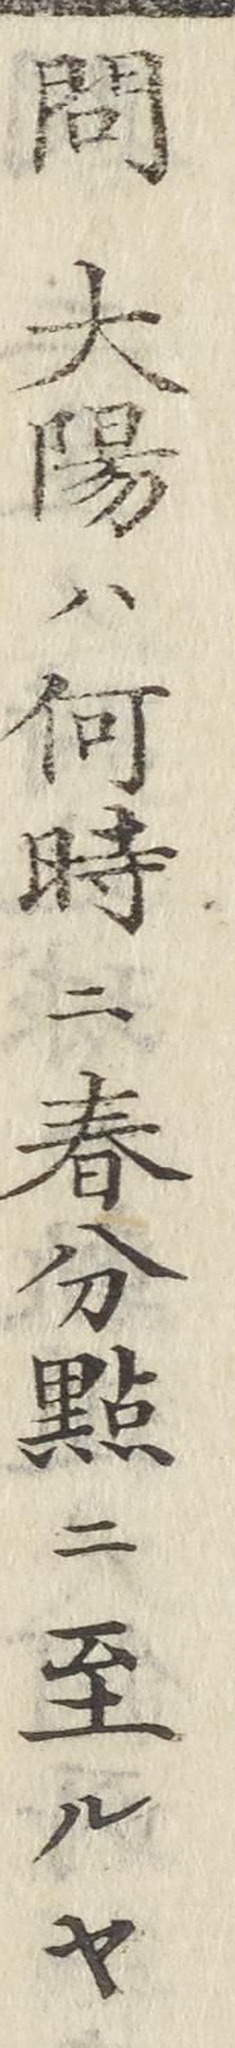問大陽ハ何時ニ春分点ニ至ルヤ
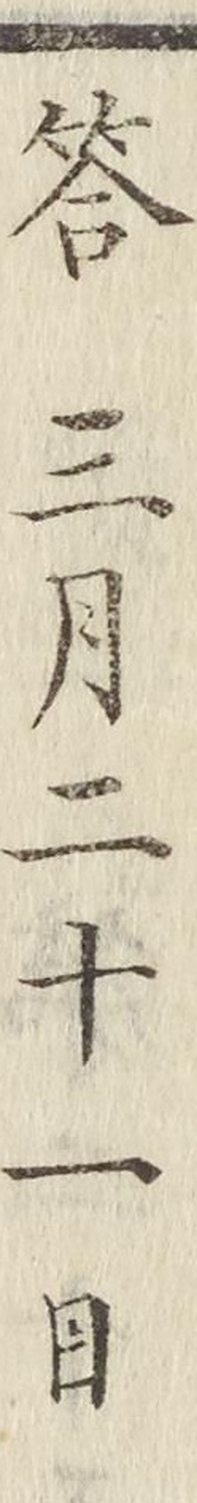答三月二十一日
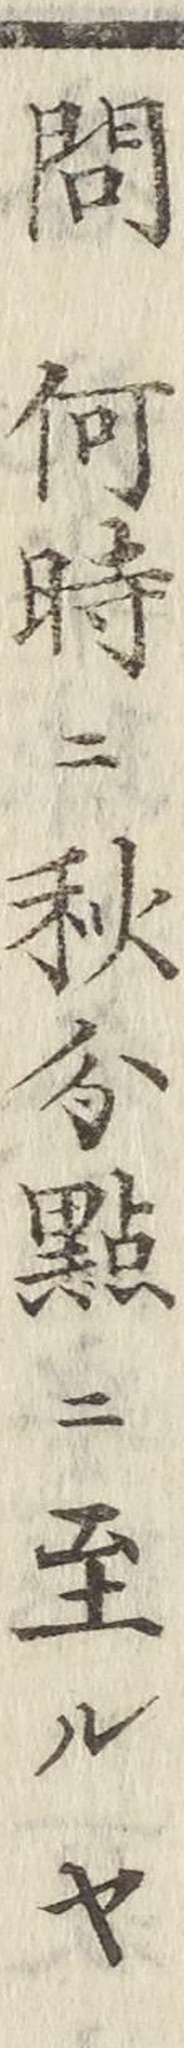問何時ニ秋分点ニ至ルヤ
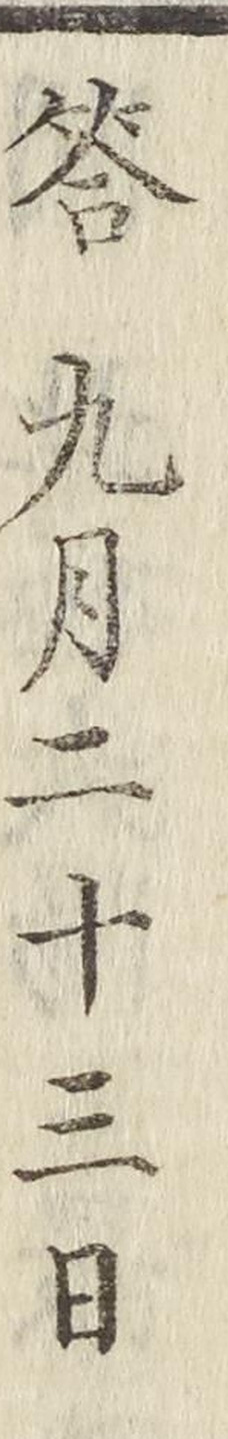答九月二十三日
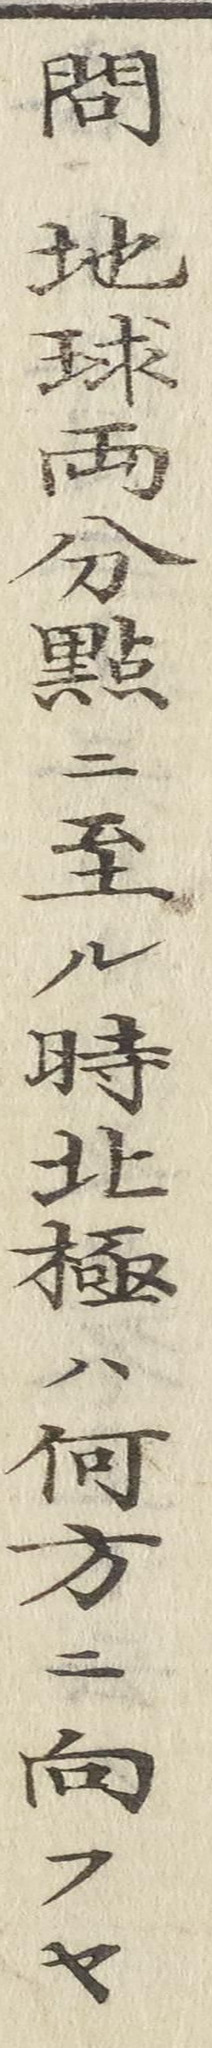問地球両分点ニ至ル時北極ハ何方ニ向フヤ
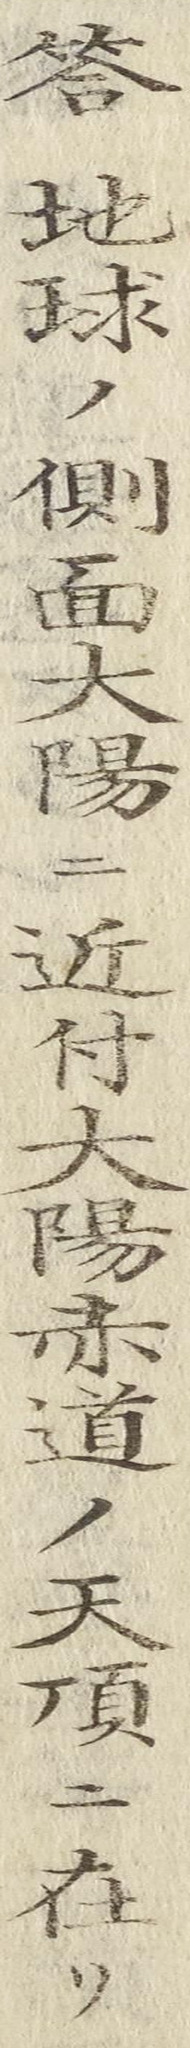答地球ノ側面大陽ニ近付大陽赤道ノ天頂ニ在リ
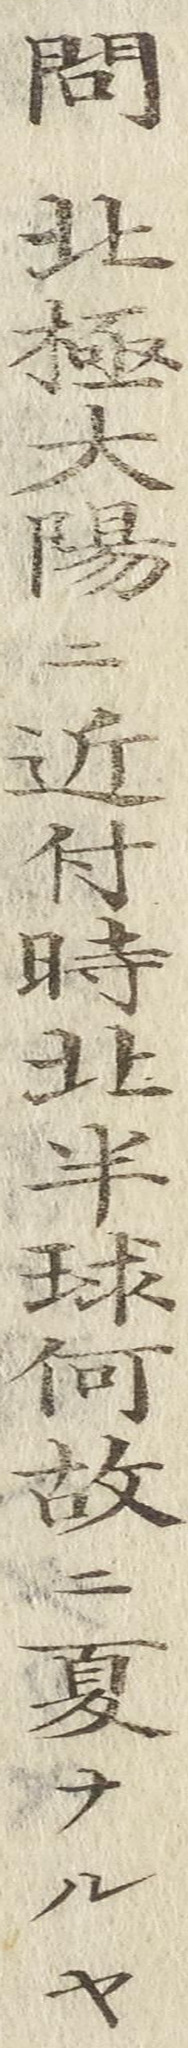問北極大陽ニ近付時北半球何故ニ夏ナルヤ
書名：星学圖説　上
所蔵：東京大学地震研究所図書室 Earthquake Research Institute Library, The University of Tokyo, JAPAN
